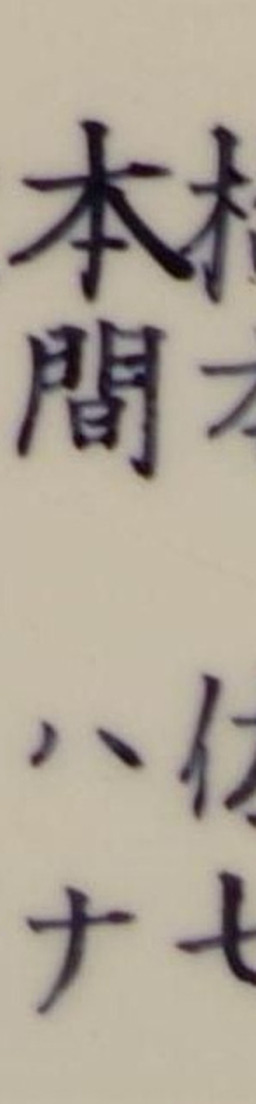本間ハナ

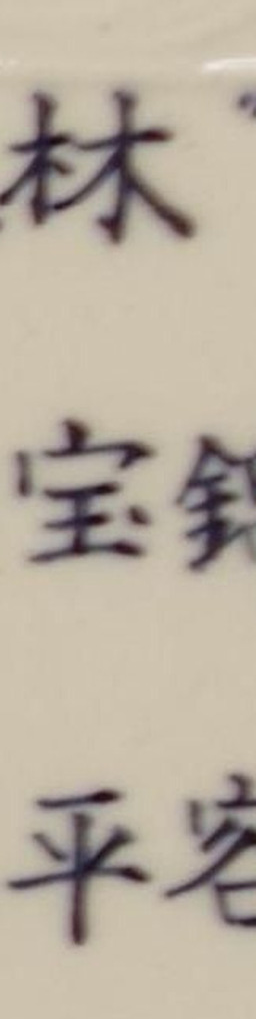林宝平
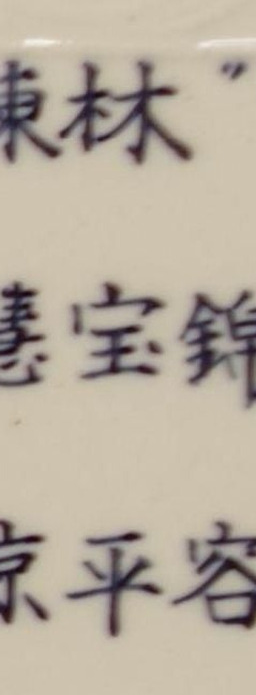林宝平
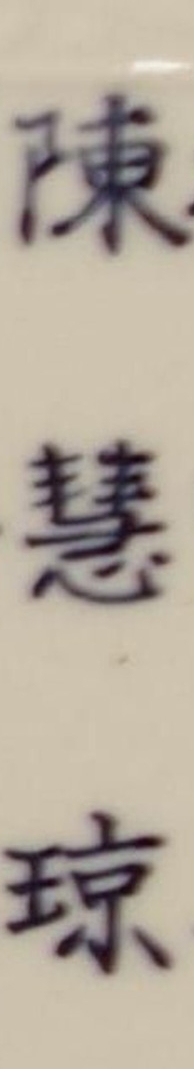陳慧琮
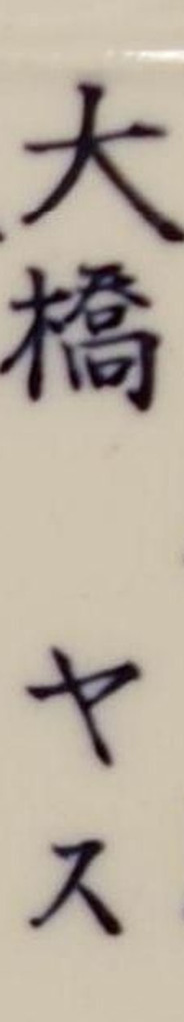大橋ヤス
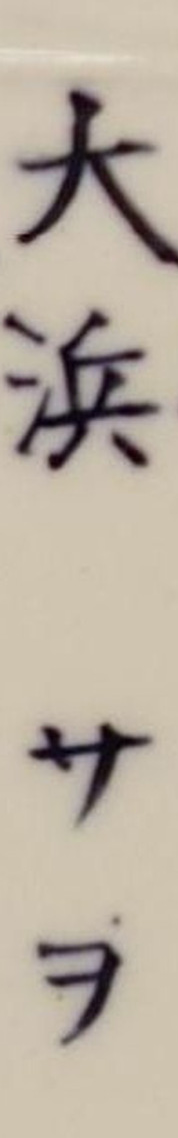大浜サヲ
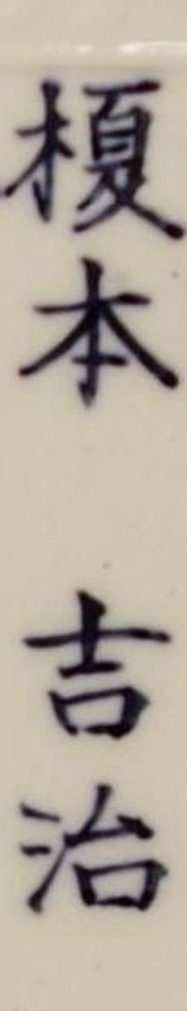榎本吉治
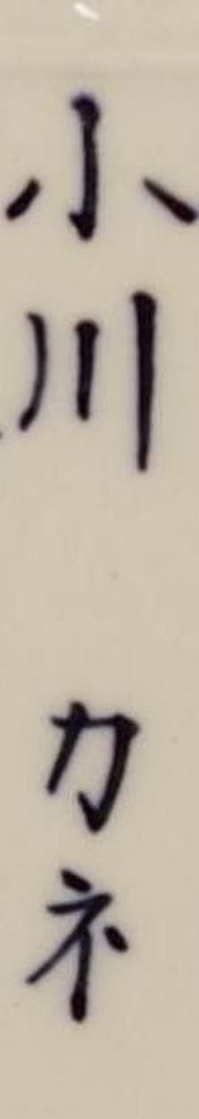小川カネ
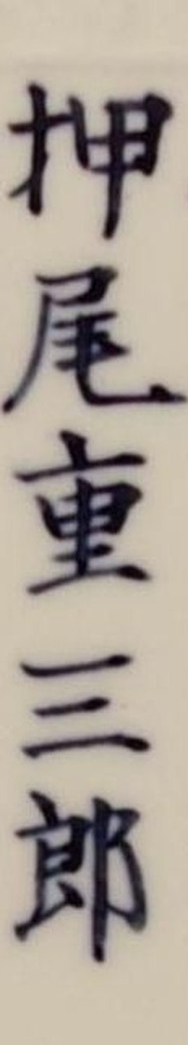押尾重三郎
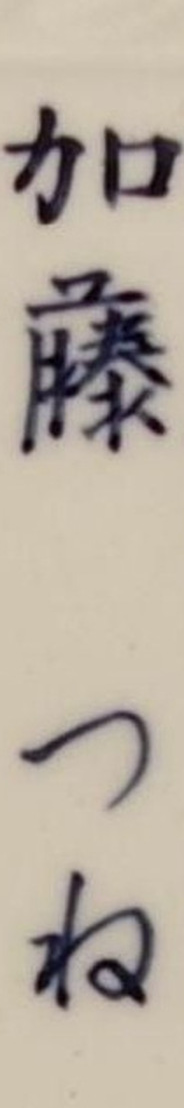加藤つね
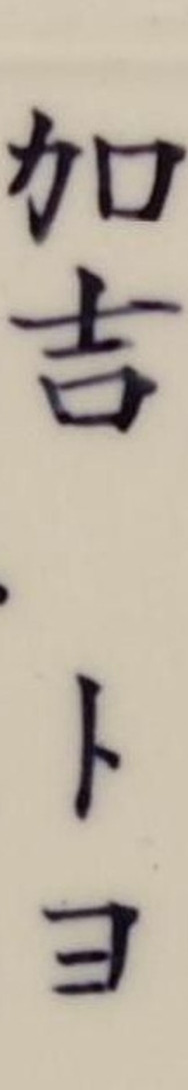加吉トヨ
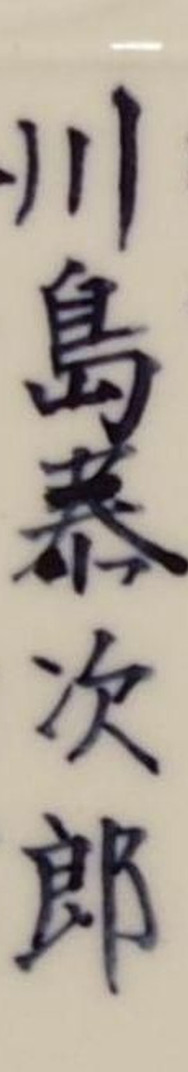川島泰次郎
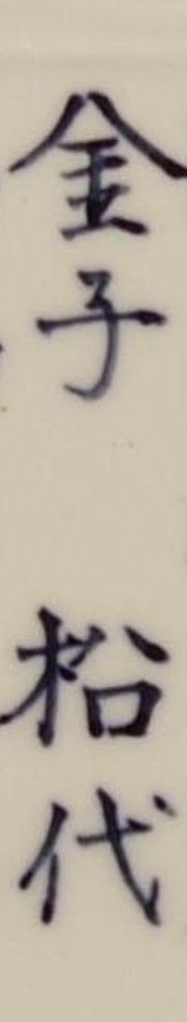金子松代
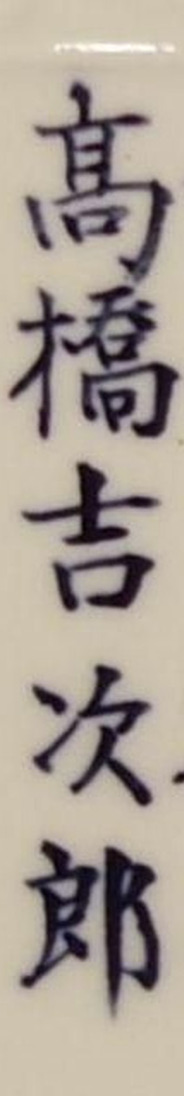髙橋吉次郎
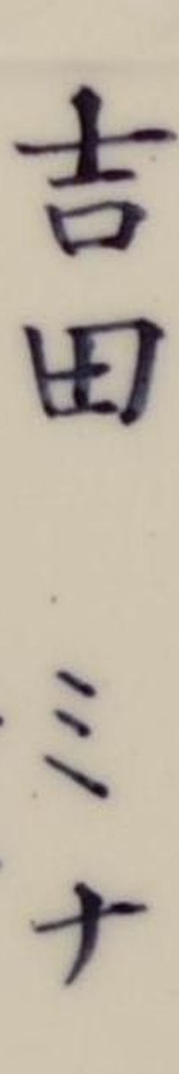吉田ミナ
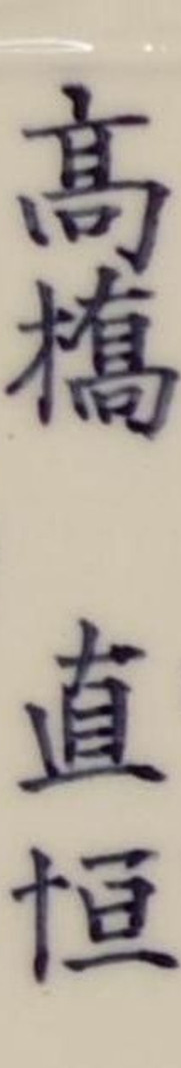髙橋直恒
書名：M~S
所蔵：高野山金剛峯寺
